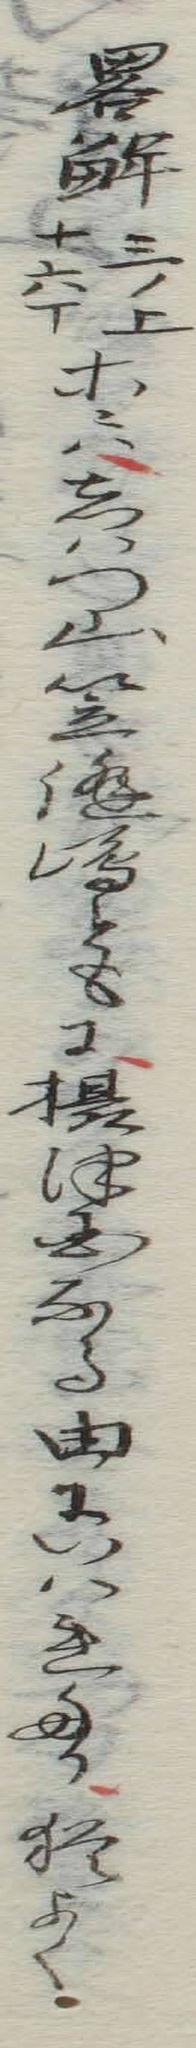略解三ノ上十六丁等ニは、しはつ山笠縫嶋ともに、摂津国なる由にいはれたり、猶よく
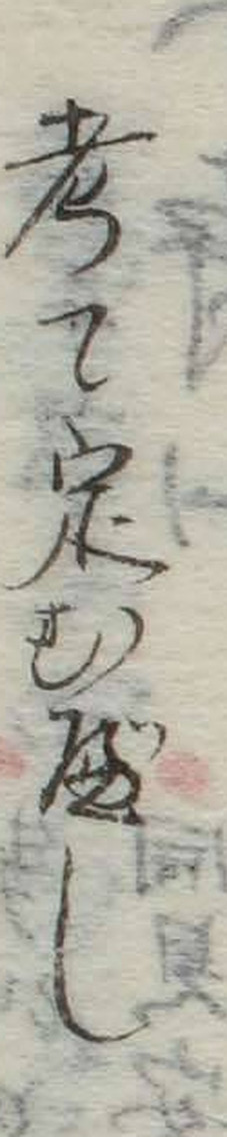考て定むべし

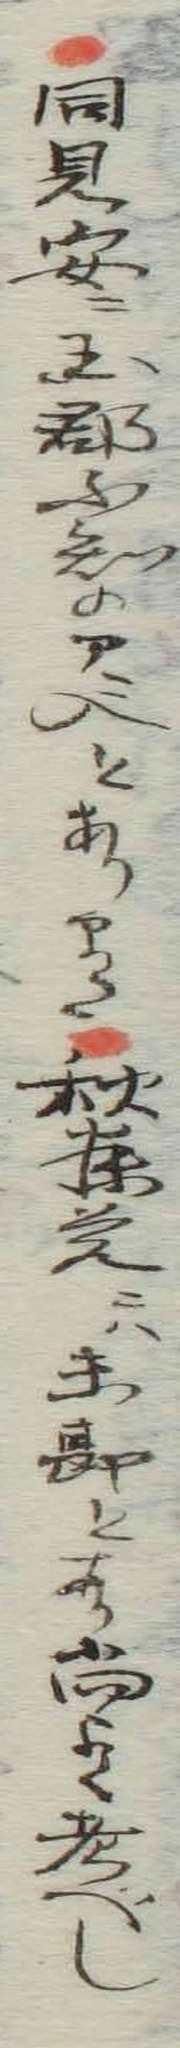●同見安ニ国郡不知の部ニ入とありまた●秋寝覚ニハ未勘とあり尚よく考べし
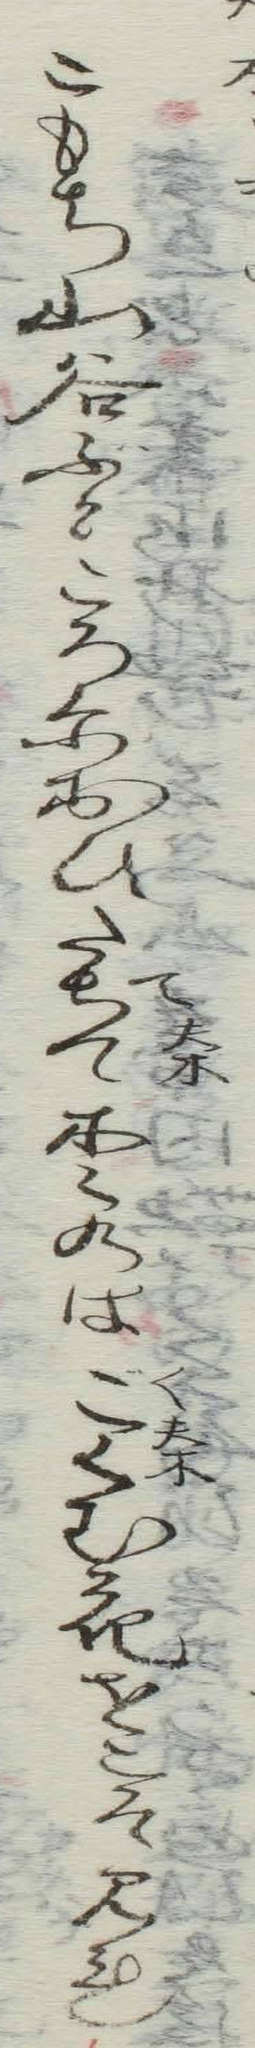こもち山谷ふところにおひたちて木々のはごくむ花をこそ見れ外
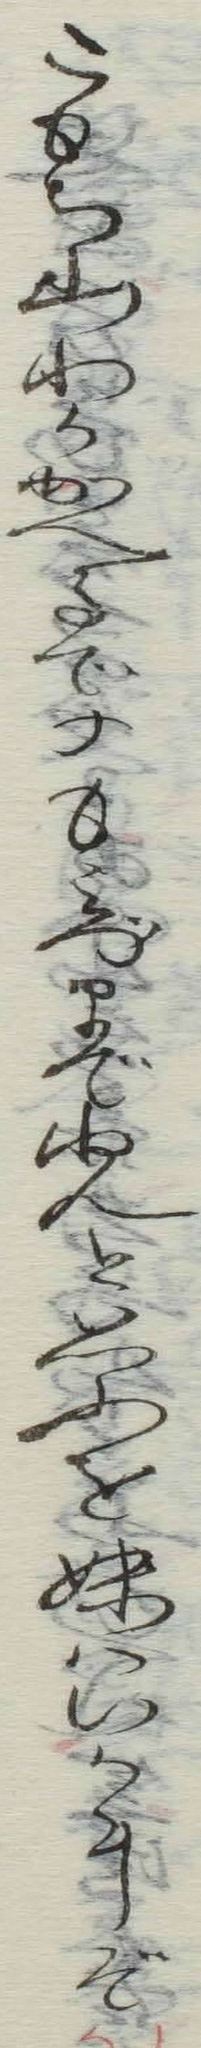こもち山わかかへるでのもみづまでねんと思ふを妹はいかにぞ外
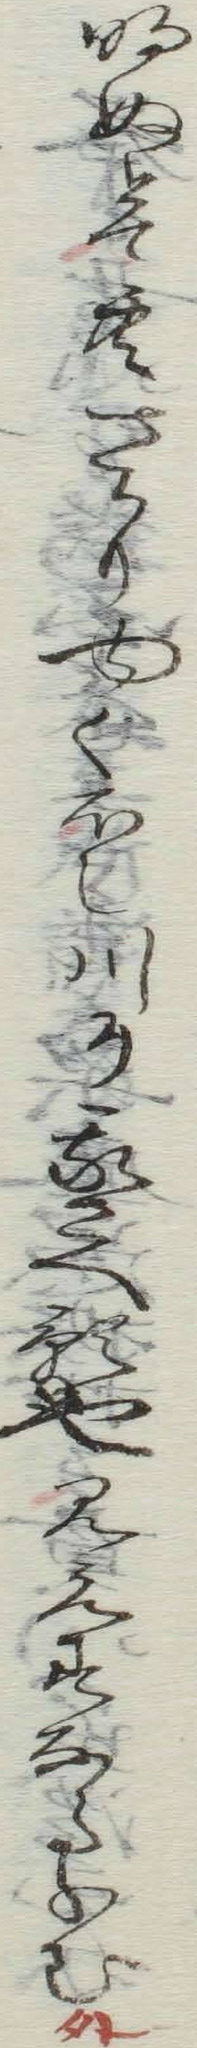明ぬとて空さかりゆくほし川に我さへ影や見えすなるらむ外
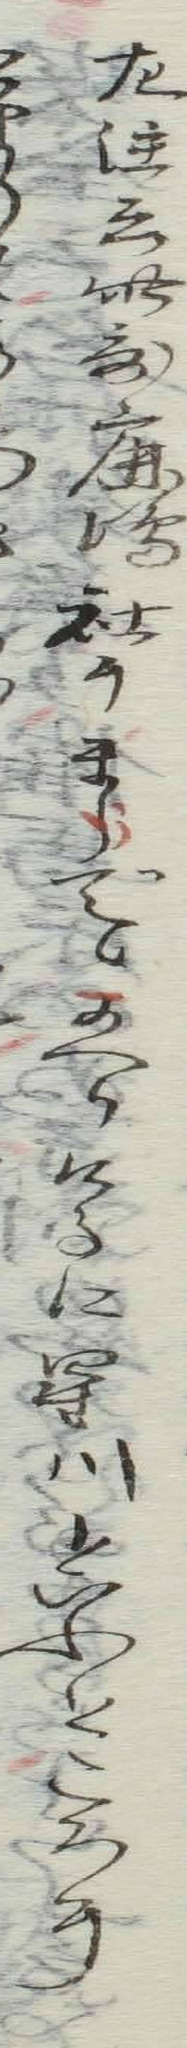左注云此歌鹿嶋社にまうでゝかへりけるに星川といふところに
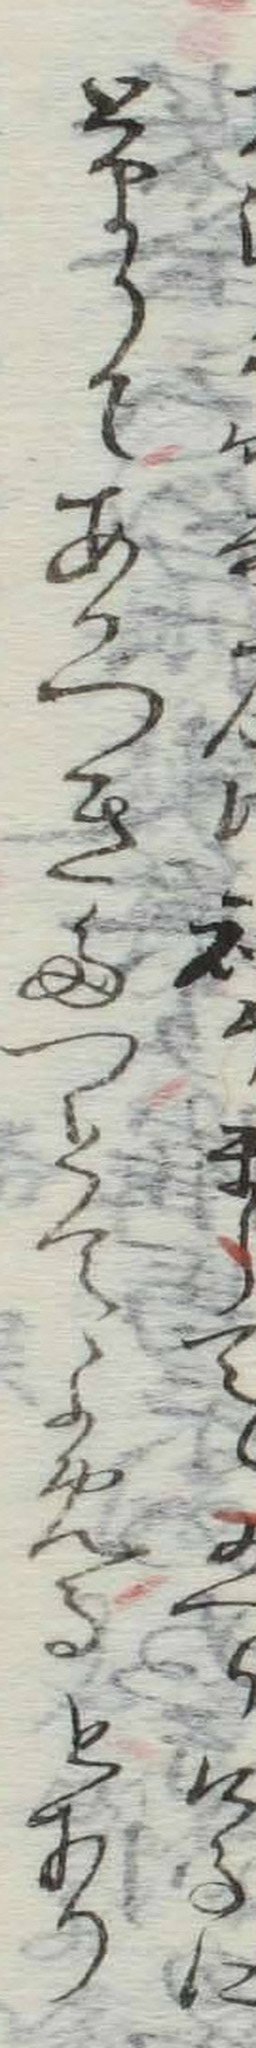とまりてあかつきたつとてよめるとあり
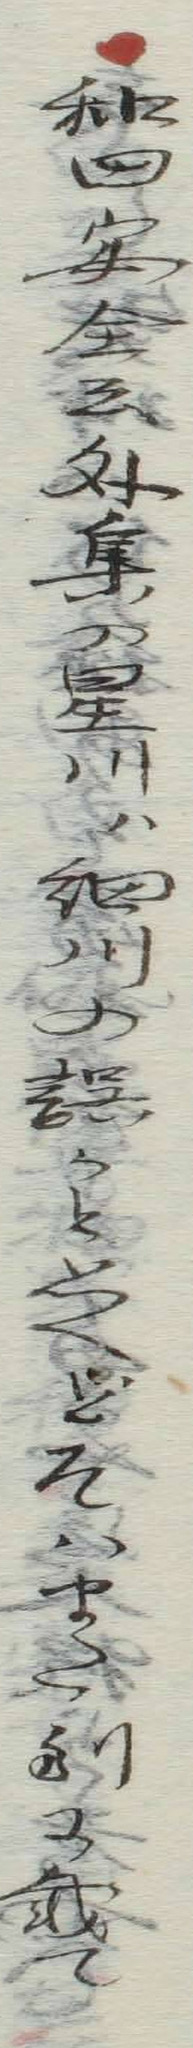●和田安全云外集の星川は細川の誤かと思へどそはまた別に載て
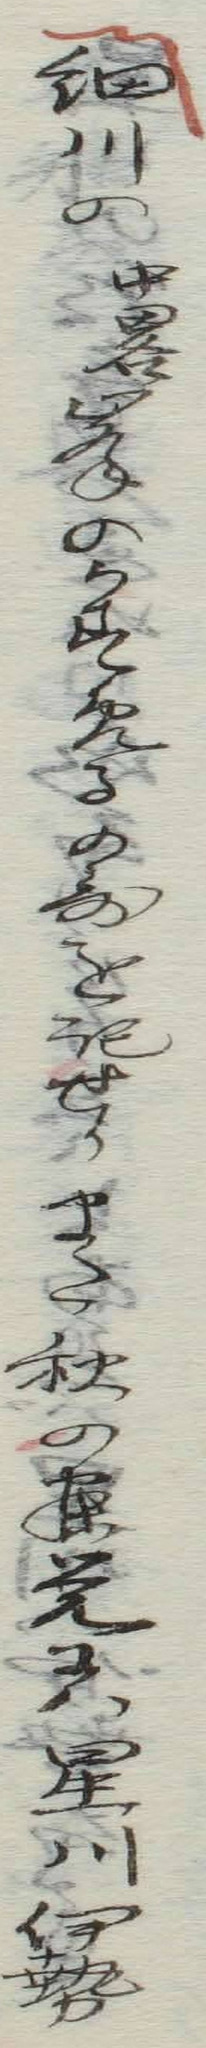〽細川の中略峰のかすめるの歌を記せりまた秋の寝覚には星川伊勢
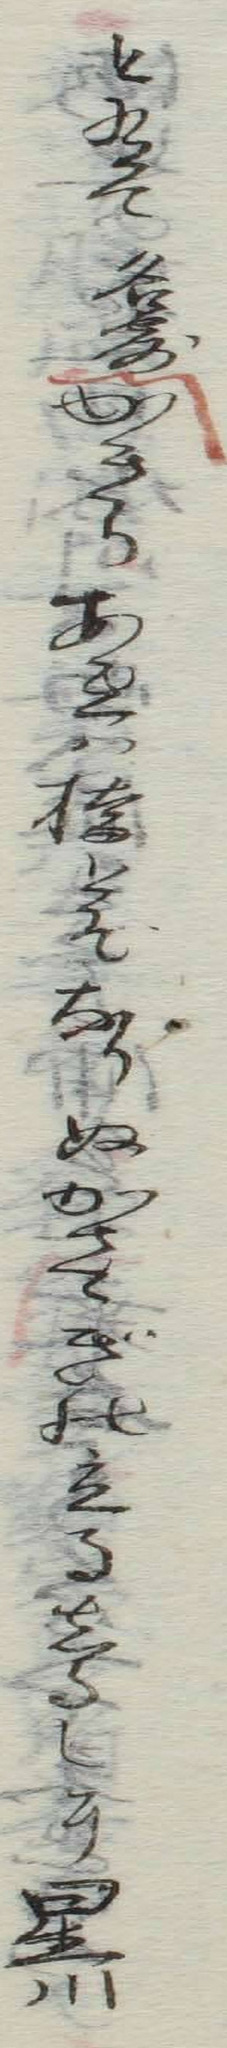と有て名寄〽かきりあれは橋とぞならぬかさゝぎの立るしるしに星川
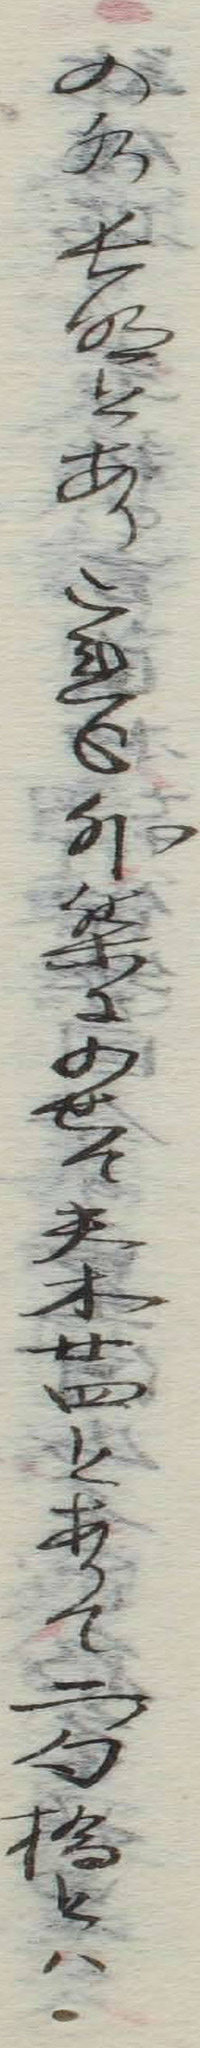の水長明とありこれも外集にのせて夫木廿四とありて二句橋とは
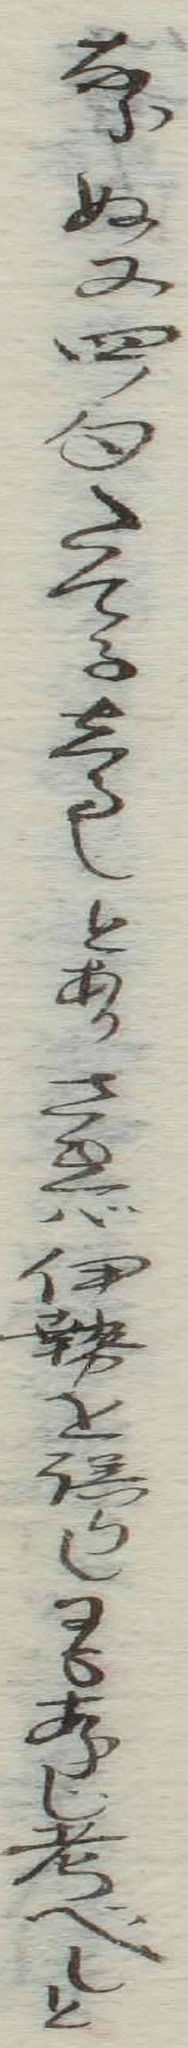ならぬ又四ノ句たてるしるしとありされば伊勢を誤りしにもあらじ考べしと
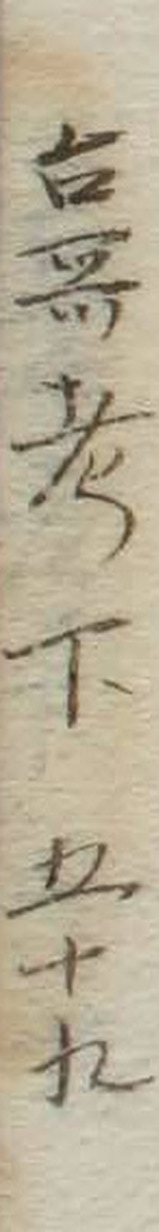古歌考下五十九

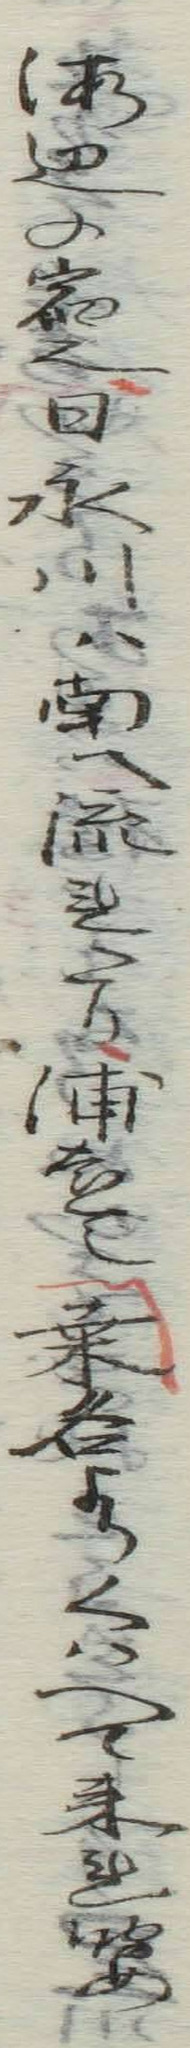海辺の宿也、日永川は南へ流れたり、浦遠し〽桑名よりくはへて来れば
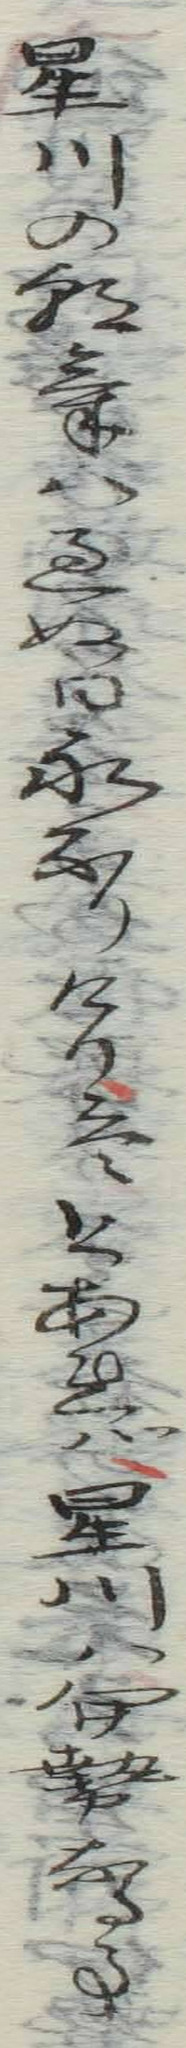星川の朝気は過ぬ日永なりけり、云々とあれば、星川は伊勢なる事
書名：三河国古跡考
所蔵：国文学研究資料館
